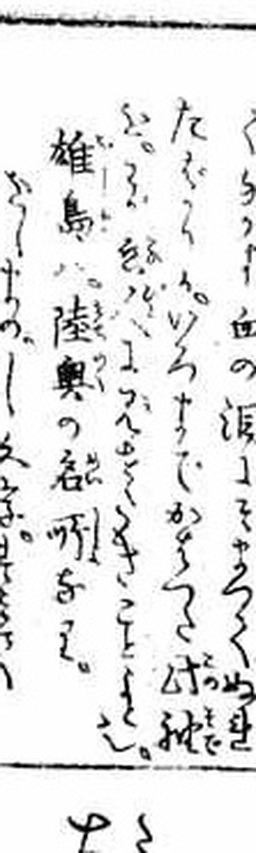をわが恋人は見せたきことよと也大
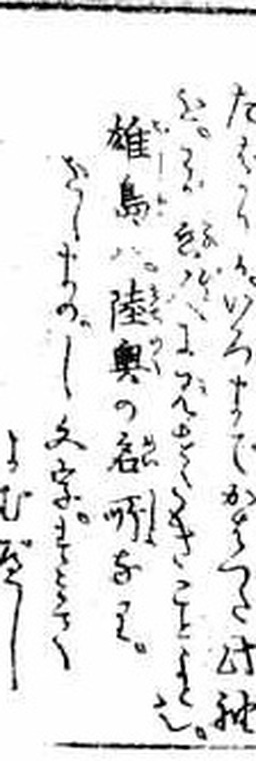雄島は陸奥の名所なり
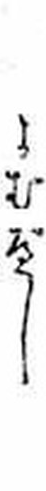よむべし
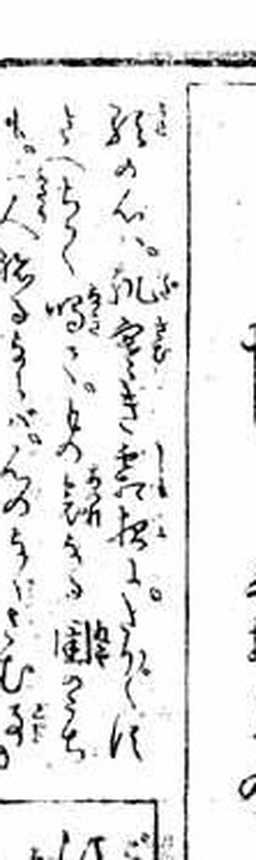歌の心は肌寒き霜夜にきり〴〵す
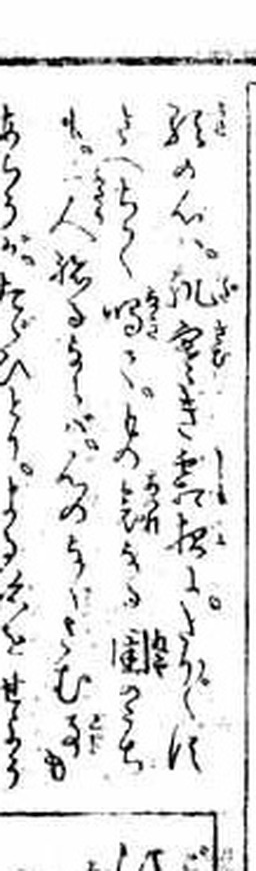さへちかく鳴てもの哀れなる閨のうち後京極
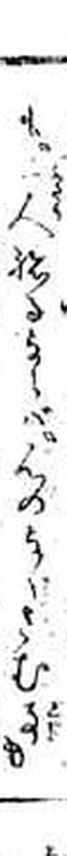も一人ねるならば心のなぐさむ事も
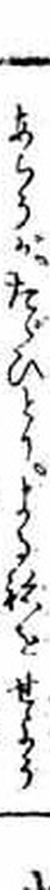あらうがたゞひとりよるねをせよう摂政
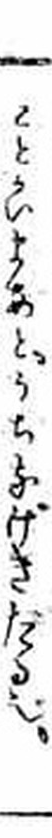ことかいなあとうちなげきたる也
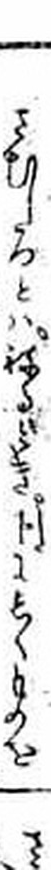さむしろとはねるとき下にしくものを
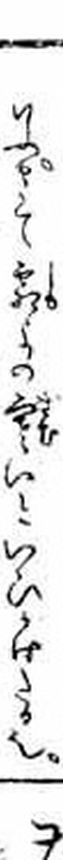いふ霜よの寒いといひかけたる也前
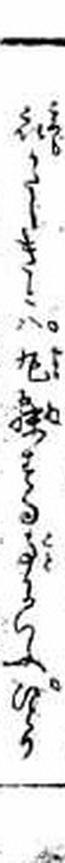衣かたしきとは○寝する事をいふひとり左
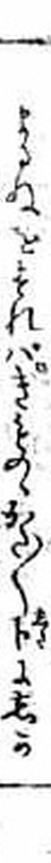まるねをすればきものゝかた〳〵下にしかるゝ
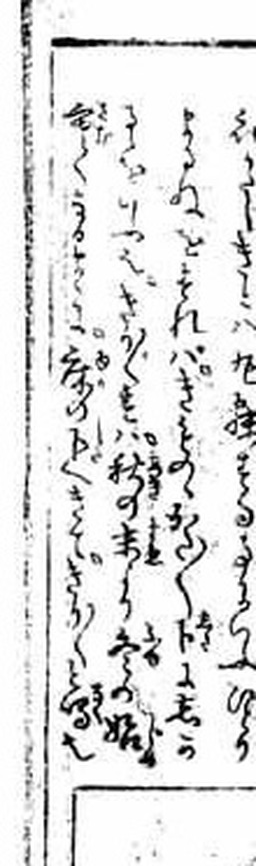事をいふ也きり〴〵すは秋の末より冬の始大臣
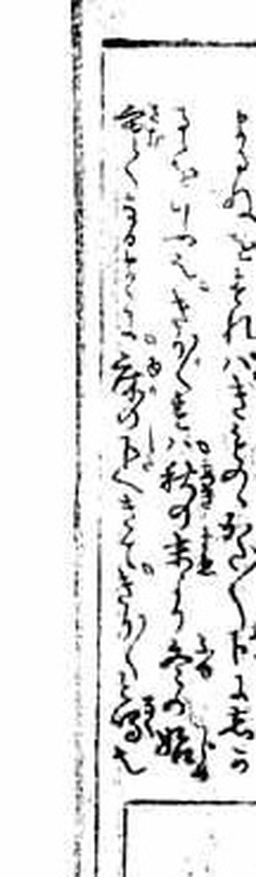寒くなることに床の下にきてきり〳〵と鳴也

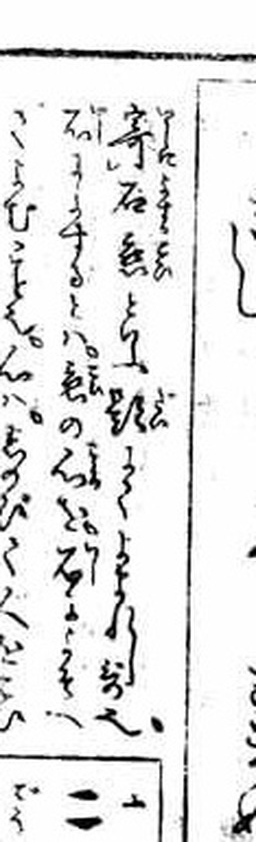寄石恋といふ題にてよまれし哥也
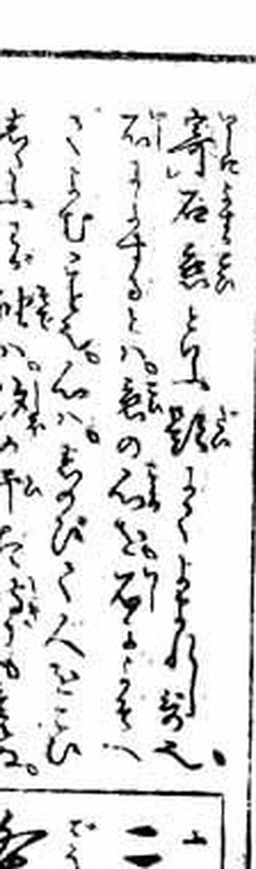石によするとは恋の心を石によそへ二
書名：小倉百人一首
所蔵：東京学芸大学教育コンテンツアーカイブ
